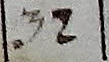32
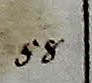58
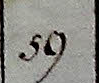59
